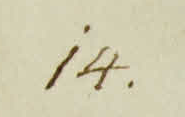14.
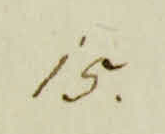15.
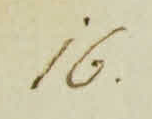16.
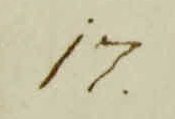17.
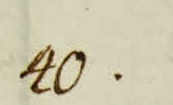40.
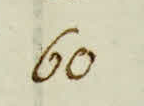60
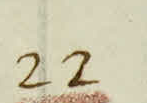22
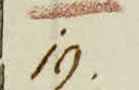19
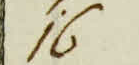16
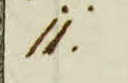11.
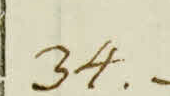34.
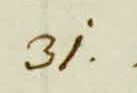31.
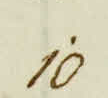10
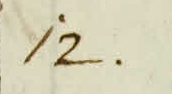12.
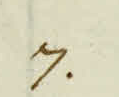7.
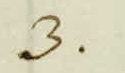3.
